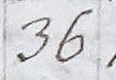36
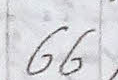66
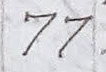77
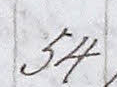54
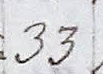33
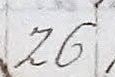26
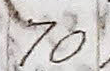70
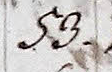53
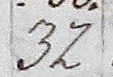32
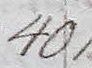40
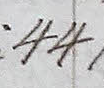44
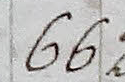66
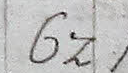62
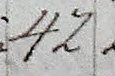42
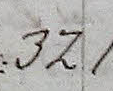32
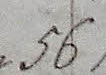56
